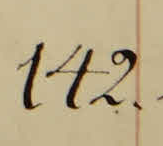142
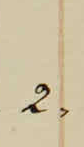2
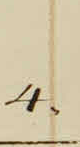4
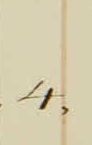4
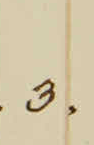3
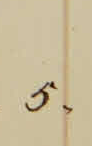5
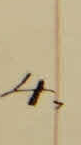4
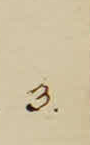3.
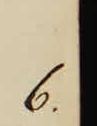6.
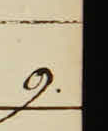9.
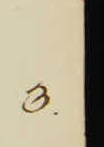3.
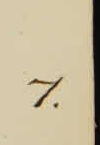7.
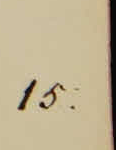15.
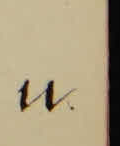11.
